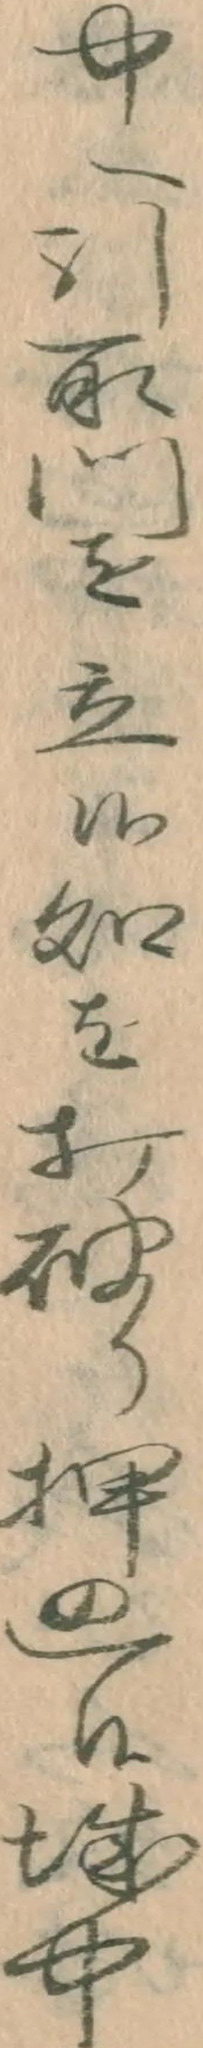中へ引取門を立候処を打破り押込候城中
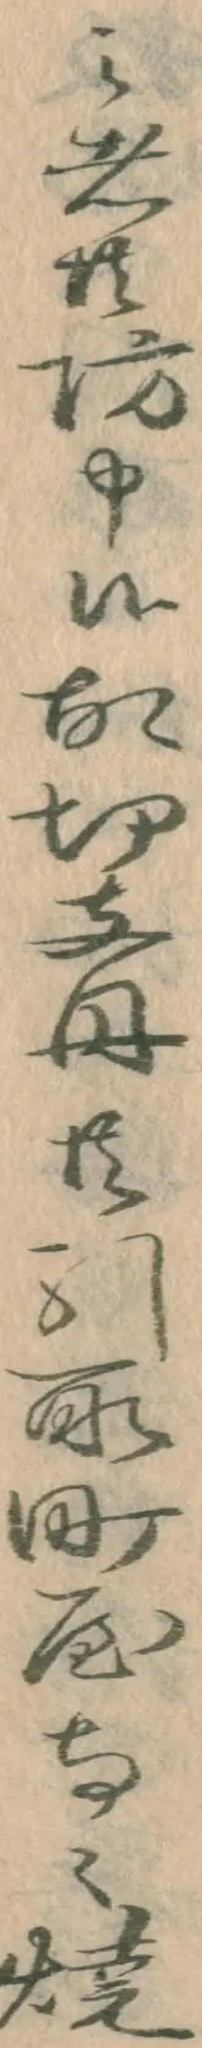之者共防申候故切支丹共引取町屋寺之焼
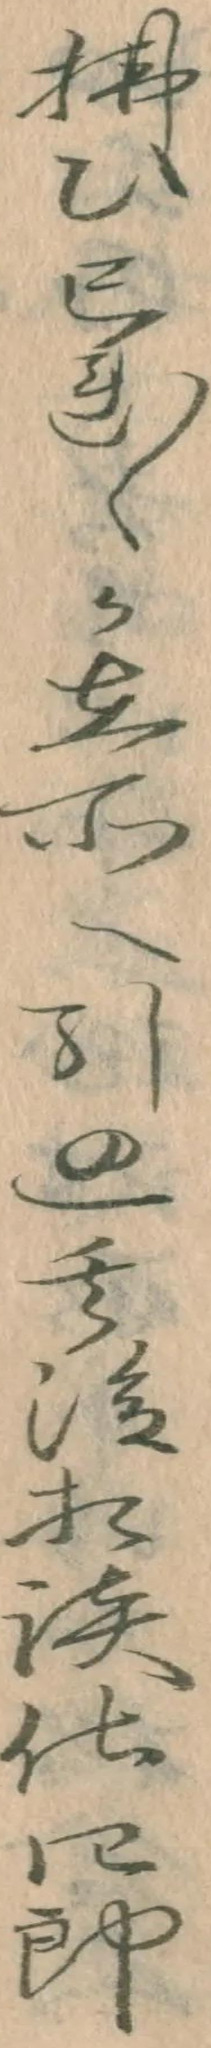掛ひ已連〱か在所へ引込其後相談仕四郎
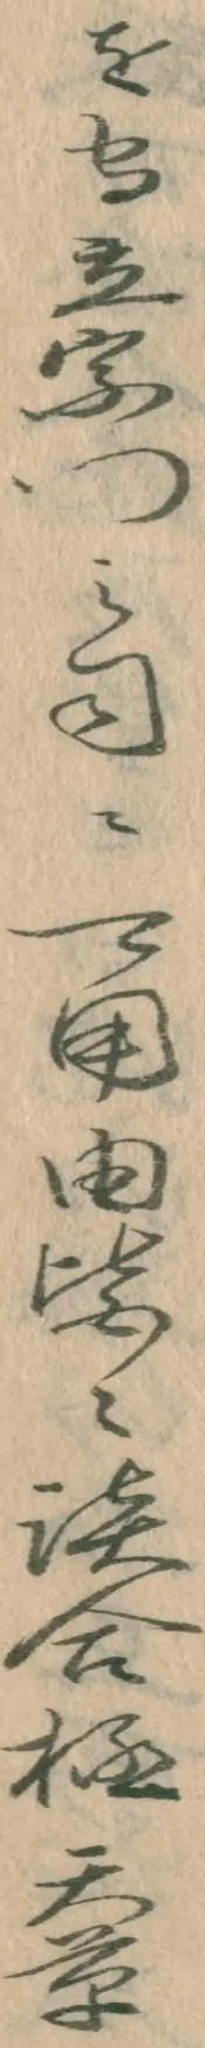を守立宗門之司に可用由皆々談合極天草
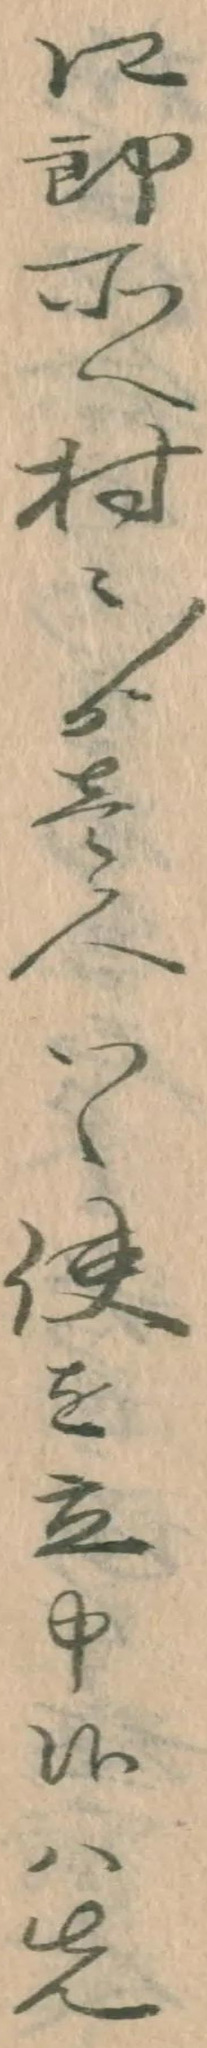四郎所へ村々ゟ壱人つゝ使を立申候は先
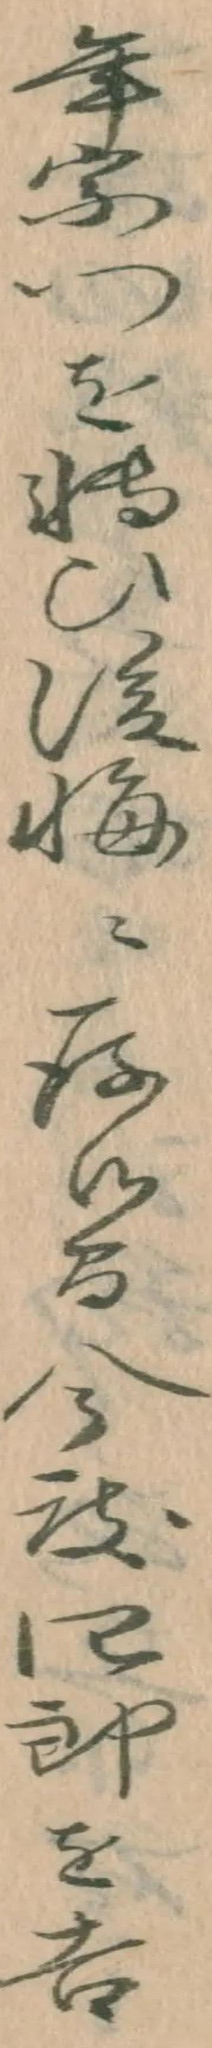年宗門を転ひ後悔に存候間今度四郎を吉
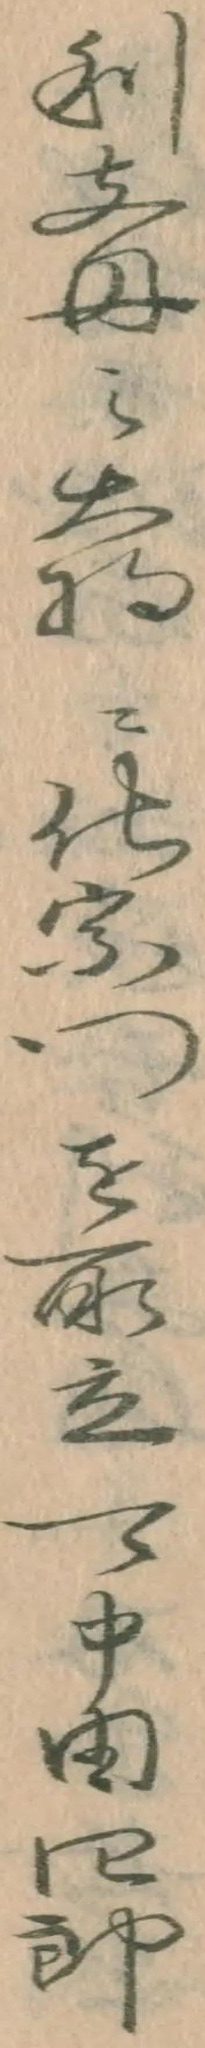利支丹之大将に仕宗門を取立可申由四郎
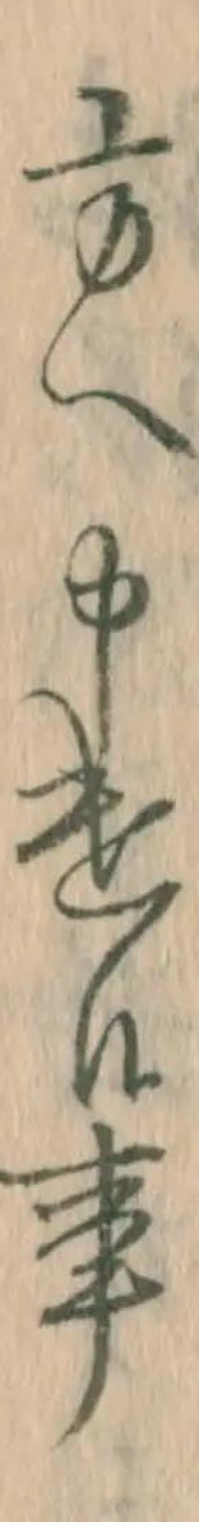方へ申遣候事
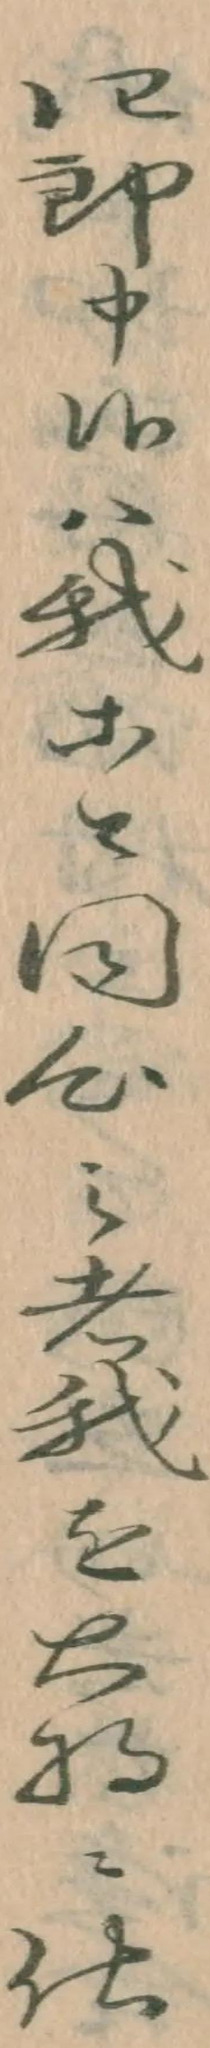一四郎申候は我等と同心之者我を大将に仕
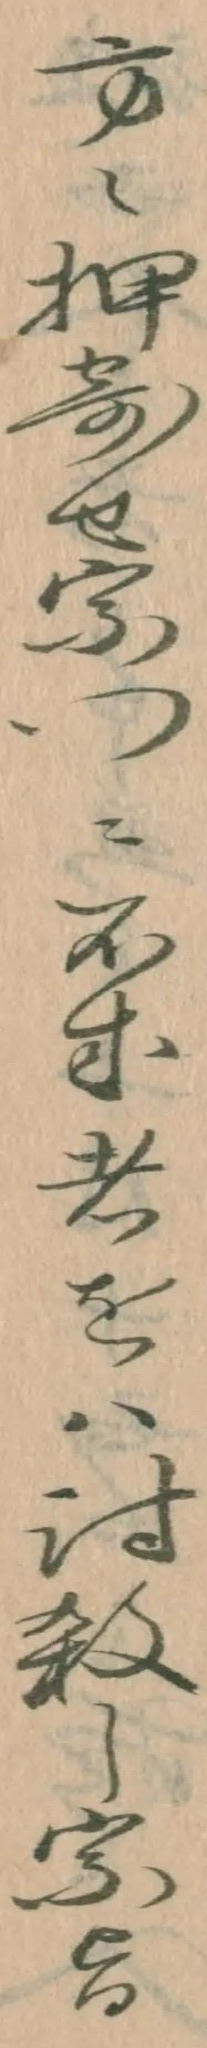方々押寄せ宗門に不成者をは討殺し宗旨
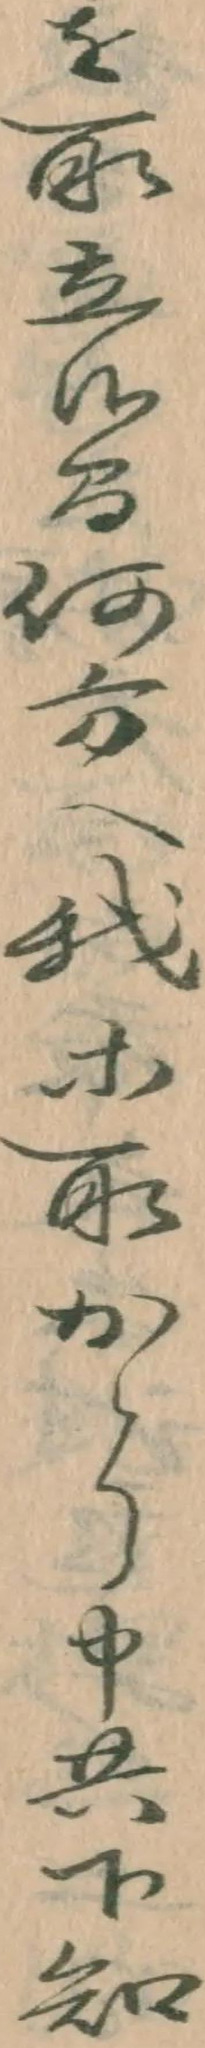を取立候間何方へ我等取かゝり申共下知
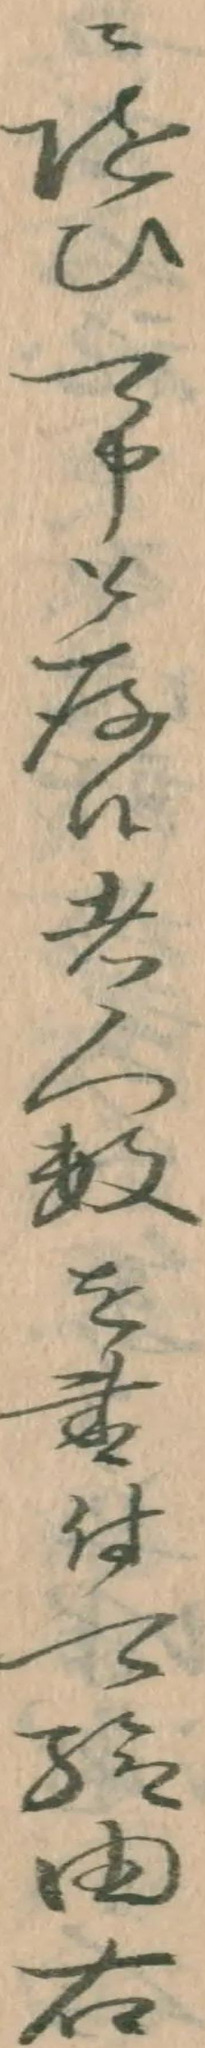に随ひ可申と存候者人数を書付可給由右
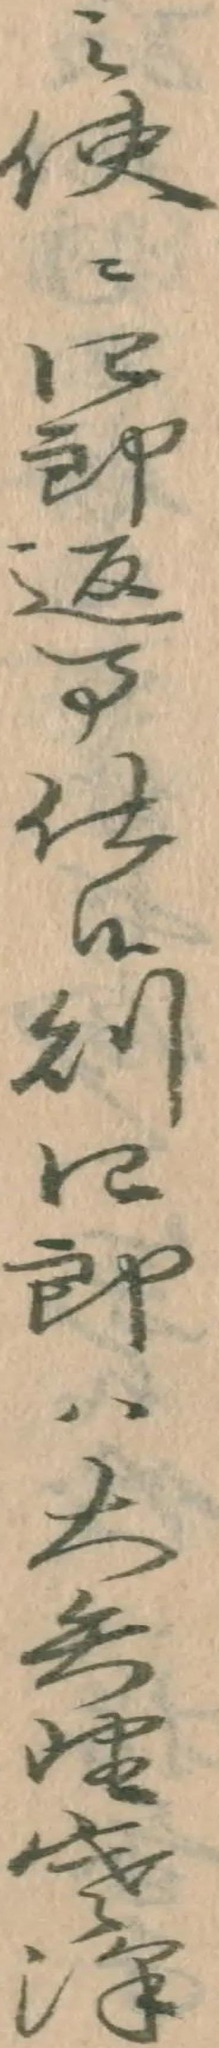之使に四郎返事仕候則四郎は大矢野寒沢
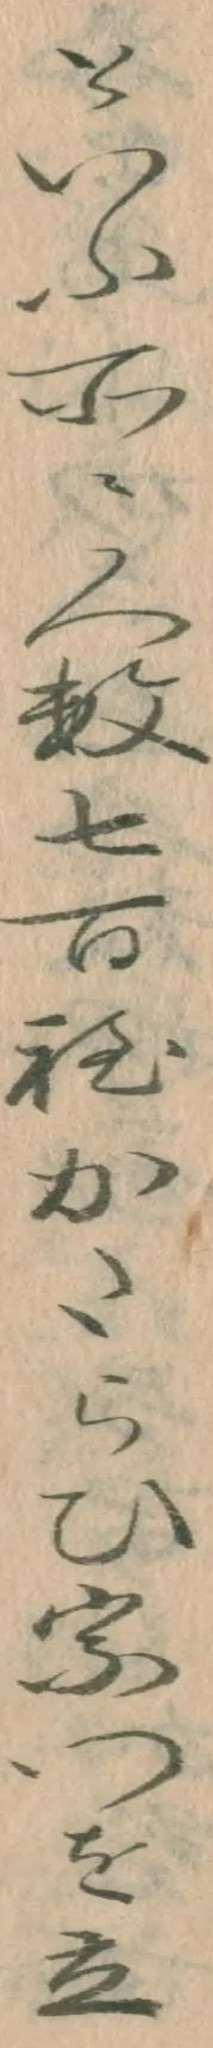といふ所に人数七百程かたらひ宗門を立
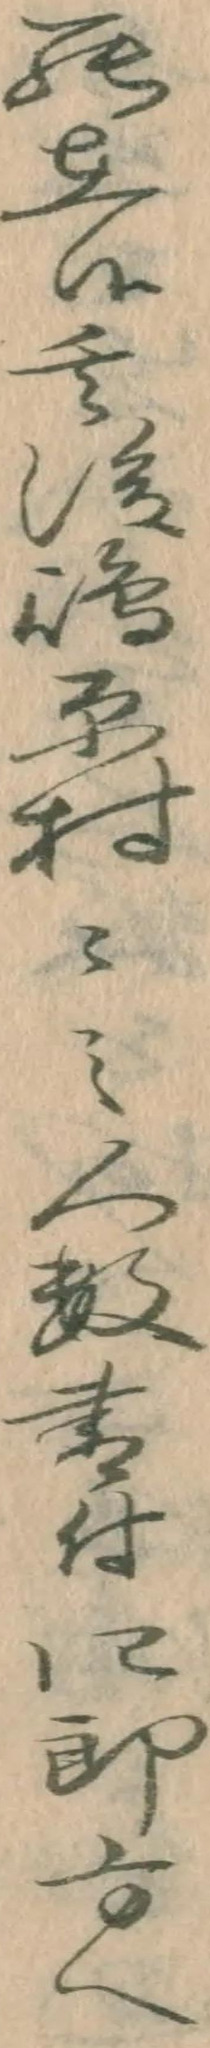罷在候其後島原村々之人数書付四郎方へ
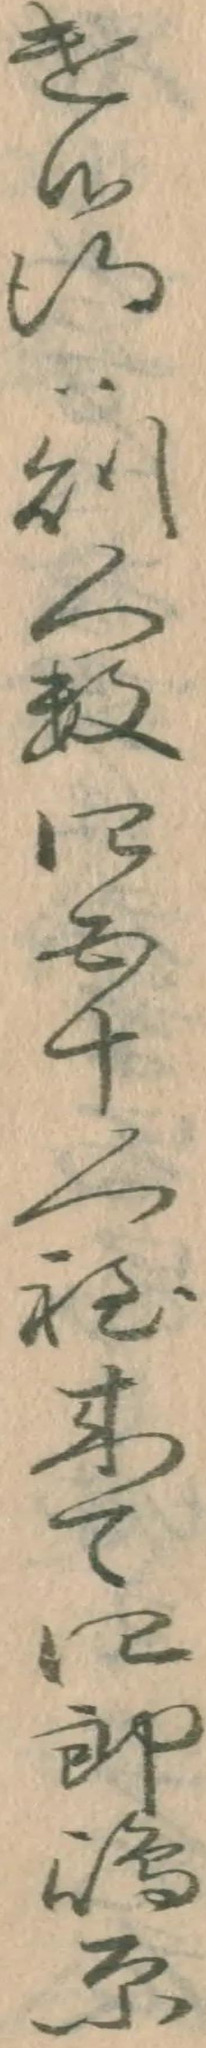遣候得は則人数四五十人程来て四郎島原
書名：切支丹御退治記 49巻. [9]
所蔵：国立国会図書館 National Diet Library, JAPAN
